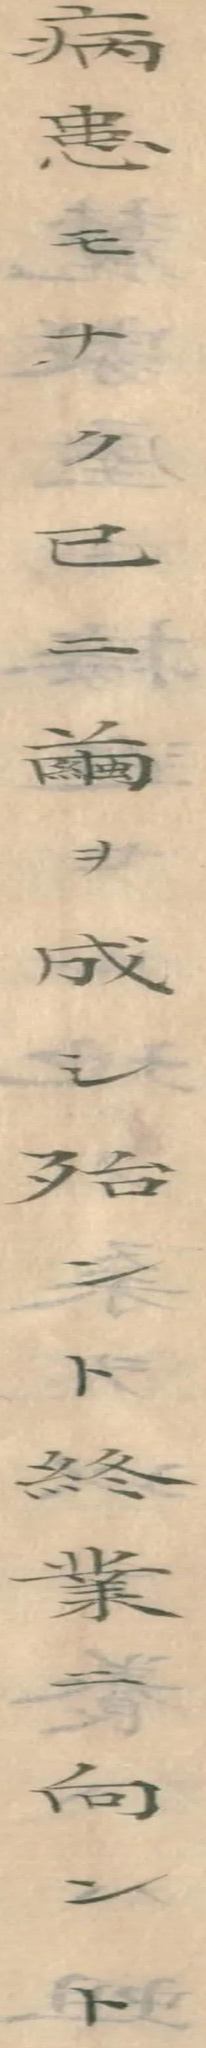病患モナク已ニ繭ヲ成シ殆ント終業ニ向ント
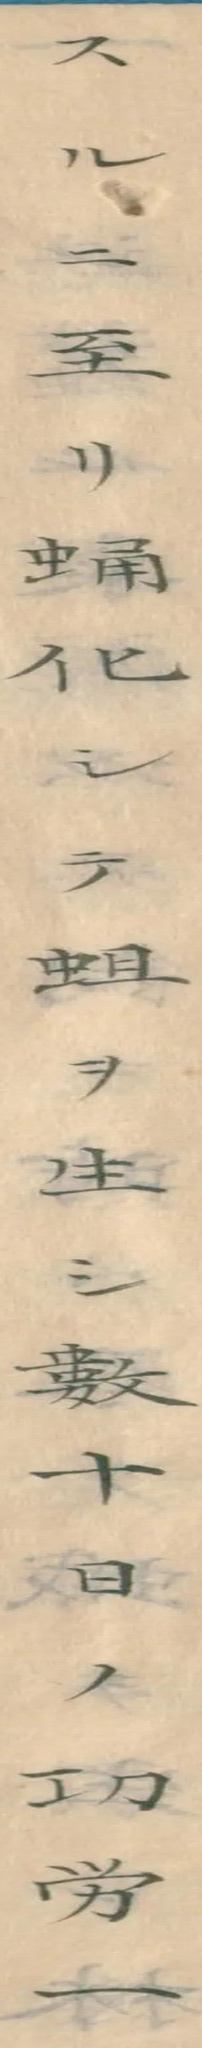スルニ至リ蛹化シテ蛆ヲ生シ数十日ノ功労一
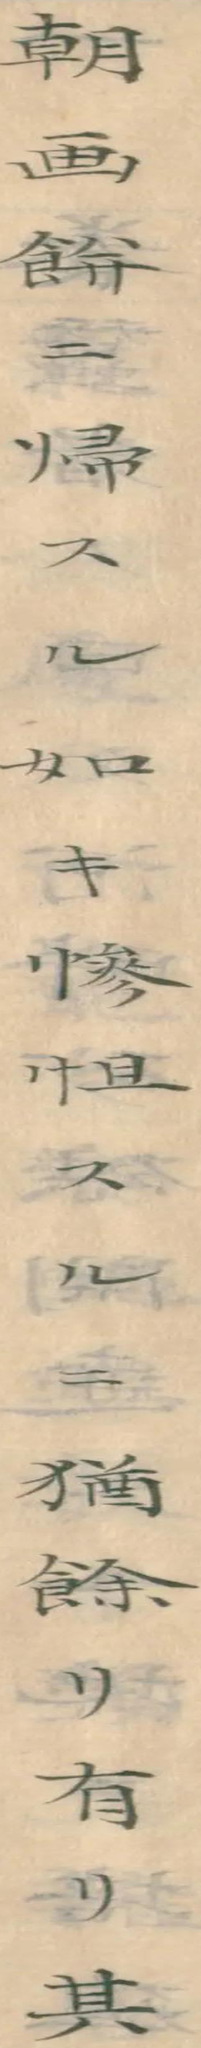朝画餅ニ帰スル如キ惨怚スルニ猶余リ有リ其
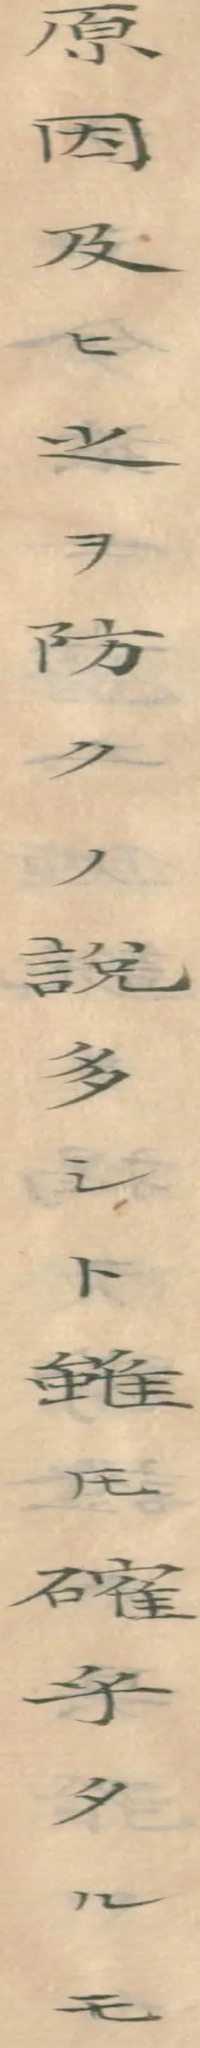原因及ヒ之ヲ防クノ説多シト雖トモ確乎タルモ

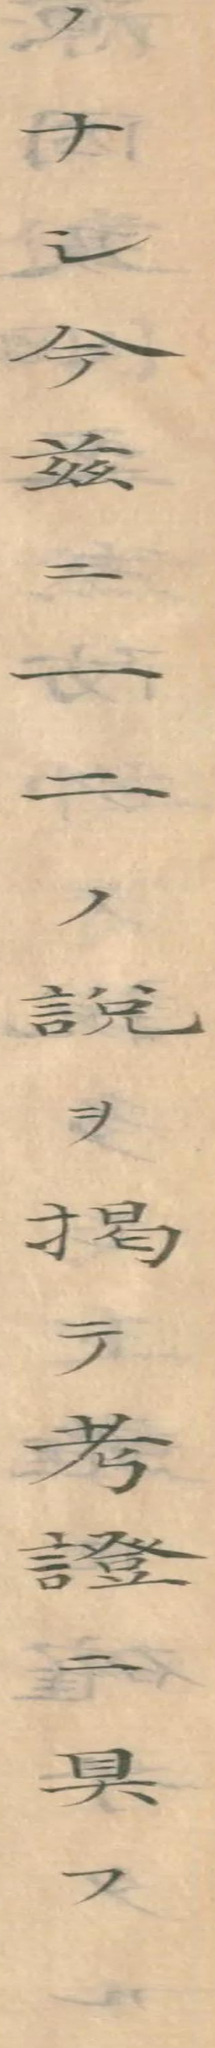ノナシ今茲ニ一二ノ説ヲ掲テ考証ニ具フ
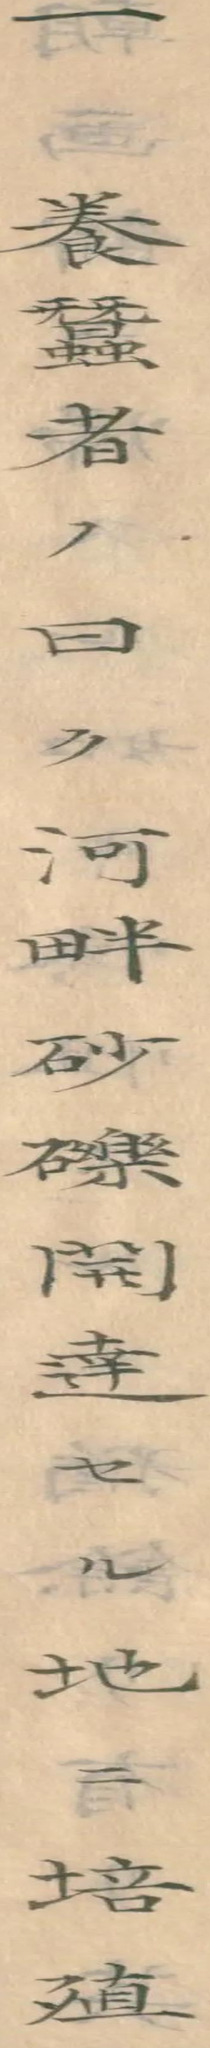一養蚕者ノ曰ク河畔砂礫開達セル地ニ培殖
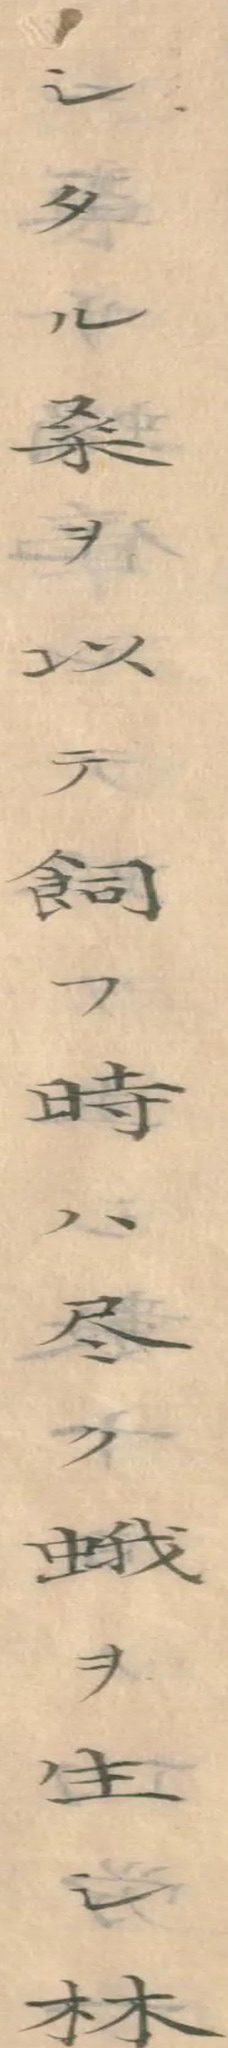シタル桑ヲ以テ飼フ時ハ尽ク蛾ヲ生シ林
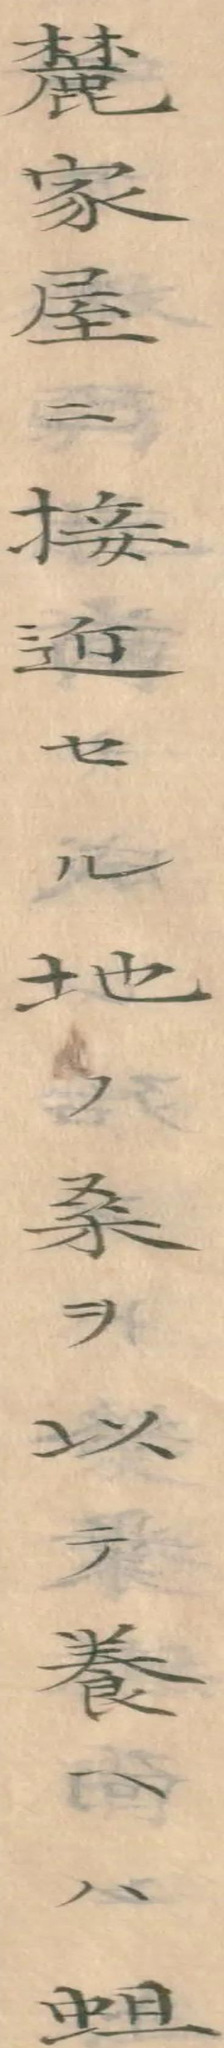麓家屋ニ接近セル地ノ桑ヲ以テ養ヘハ蛆
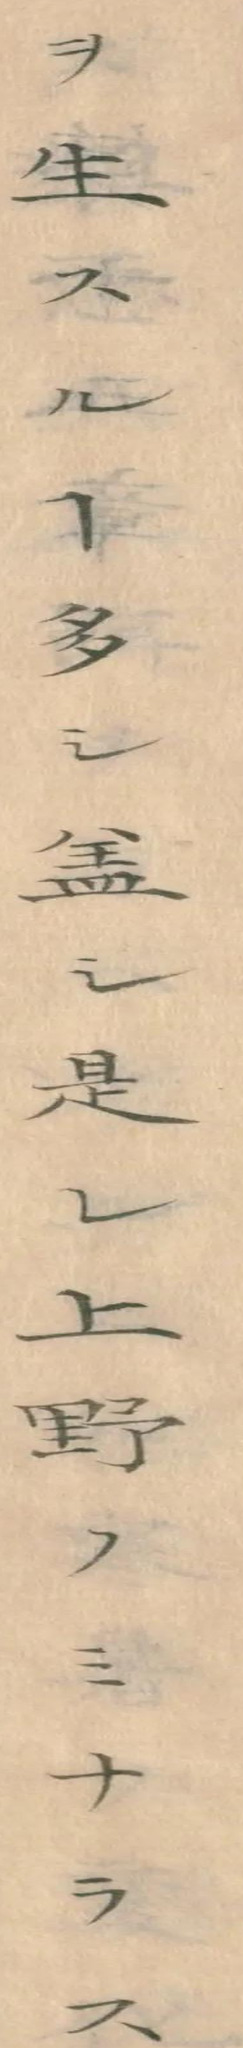ヲ生スルコト多シ蓋シ是レ上野ノミナラス
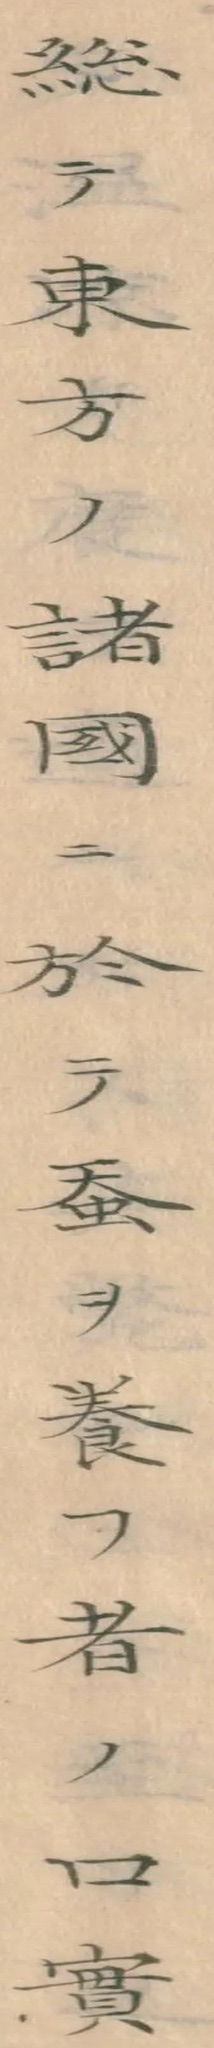総テ東方ノ諸国ニ於テ蚕ヲ養フ者ノ口実
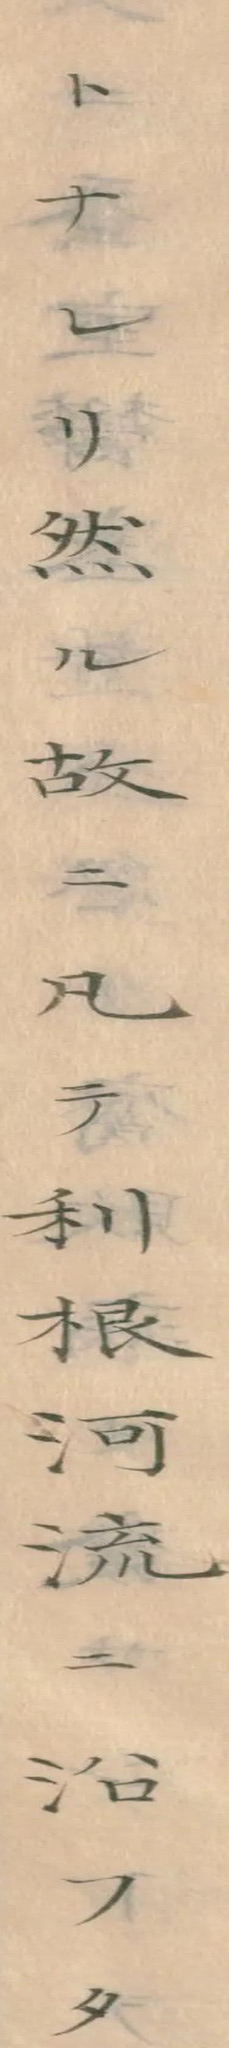トナレリ然ル故ニ凡テ利根河流ニ沿フタ
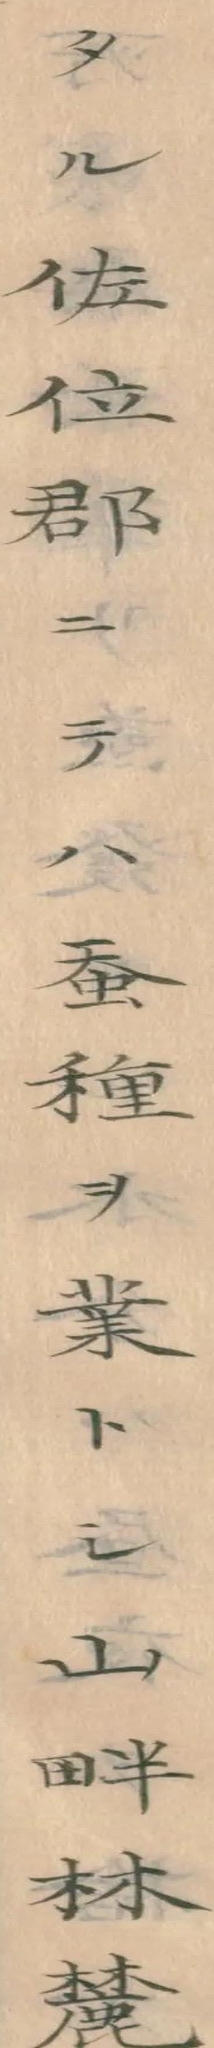タル佐位郡ニテハ蚕種ヲ業トシ山畔林麓
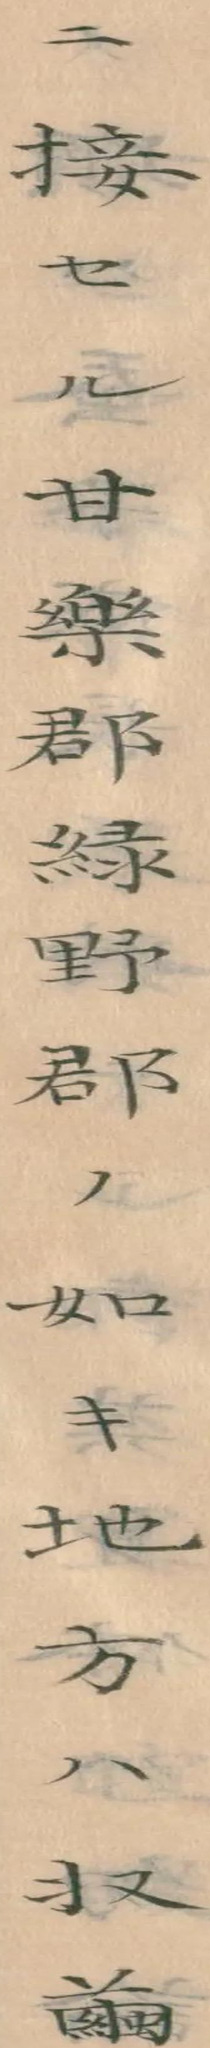ニ接セル甘楽郡緑野郡ノ如キ地方ハ収繭
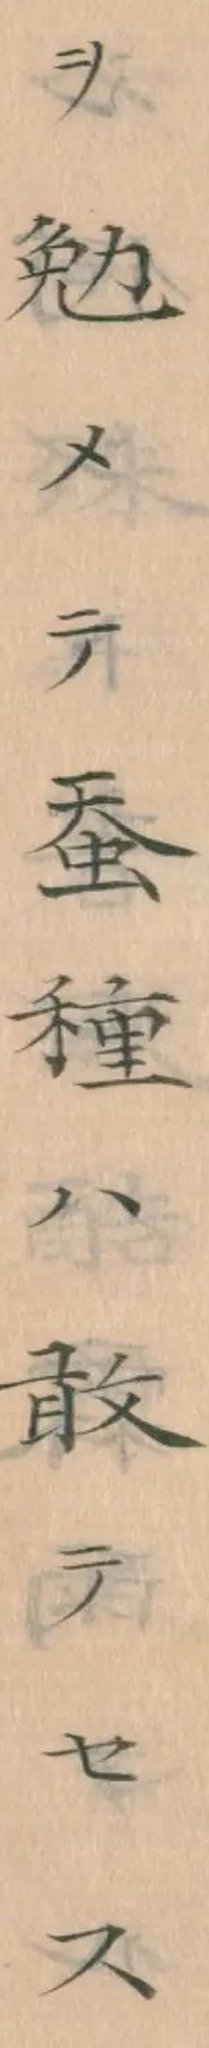ヲ勉メテ蚕種ハ敢テセス
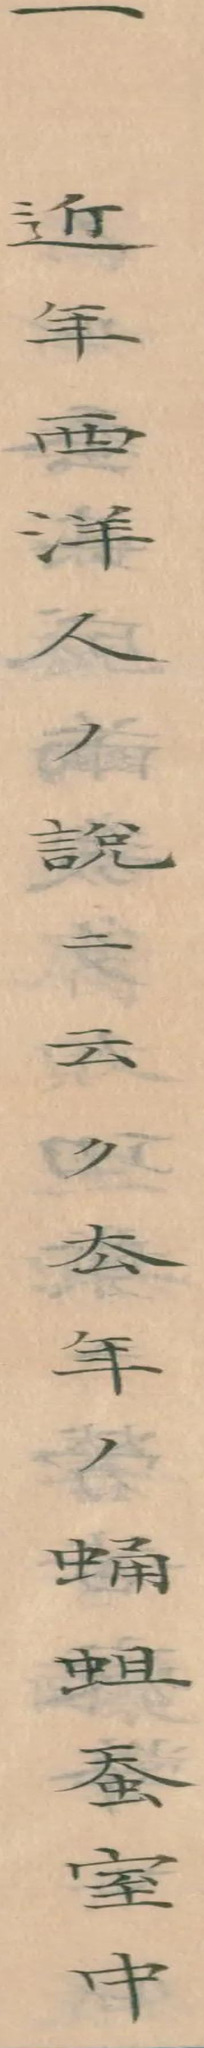一近年西洋人ノ説ニ云ク去年ノ蛹蛆蚕室中
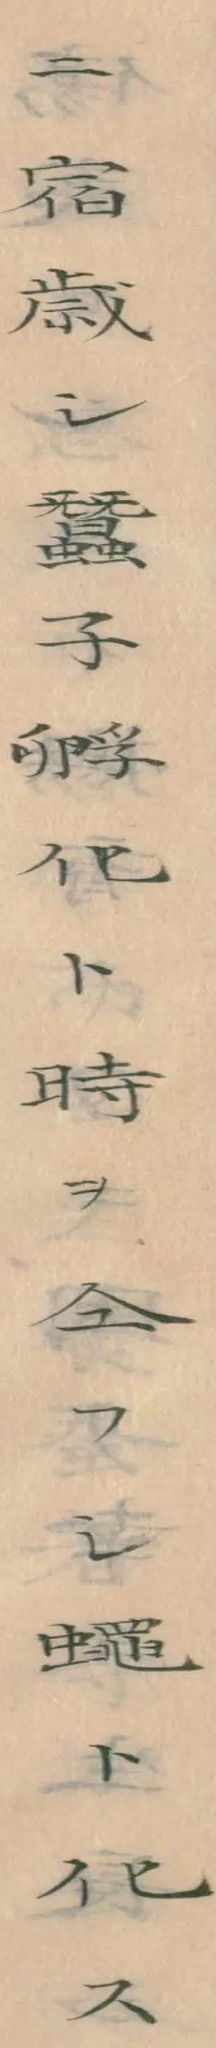ニ宿歳シ蚕子孵化ト時ヲ仝フシ蝿ト化ス
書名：蚕桑集成
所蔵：国立国会図書館 National Diet Library, JAPAN
